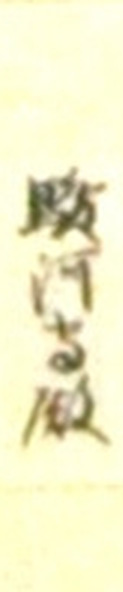駿河守殿
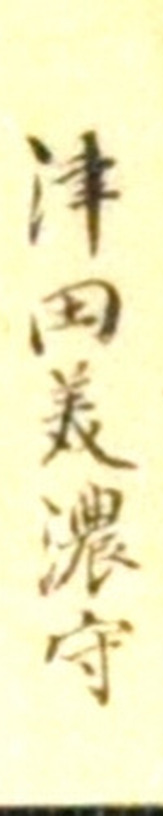津田美濃守

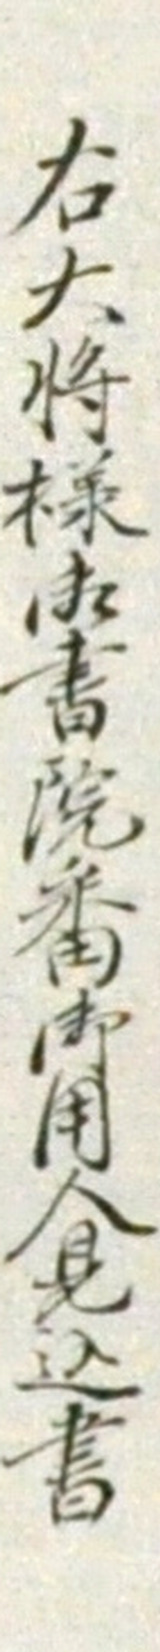右大将様御書院番御用人見込書
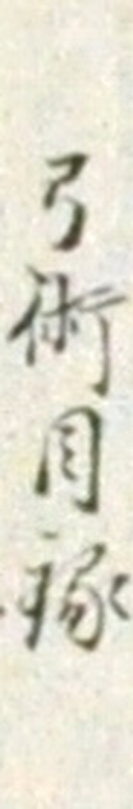弓術目録
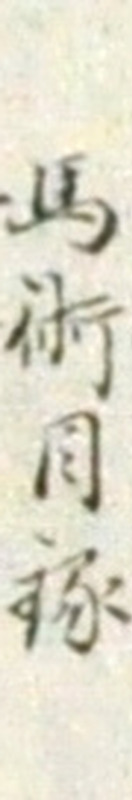弓術目録
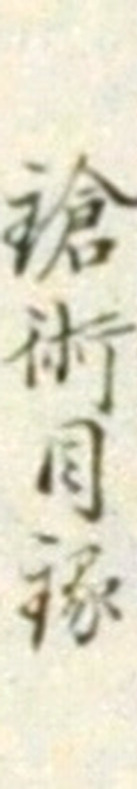鎗術目録
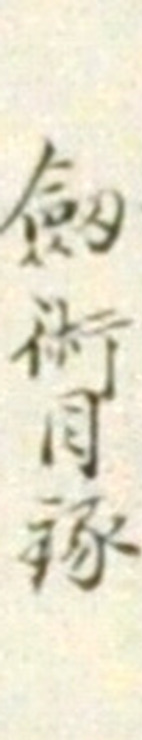弓術目録
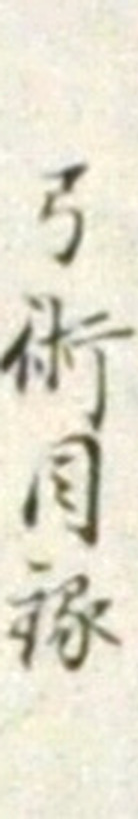弓術目録
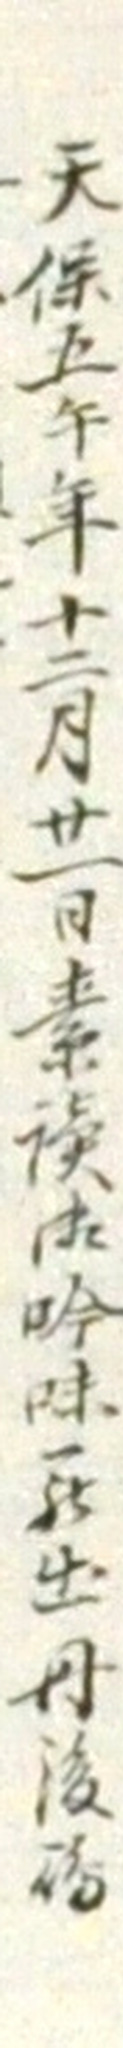天保五午年十二月廿一日素読御吟味罷出丹後嶋
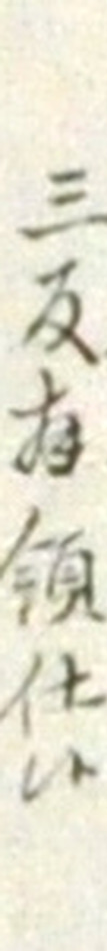三反拝領仕候
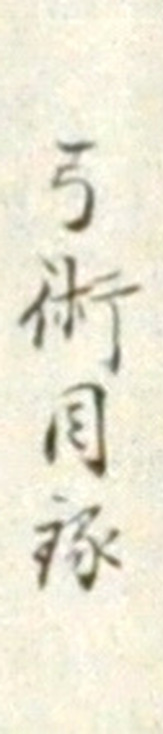弓術目録
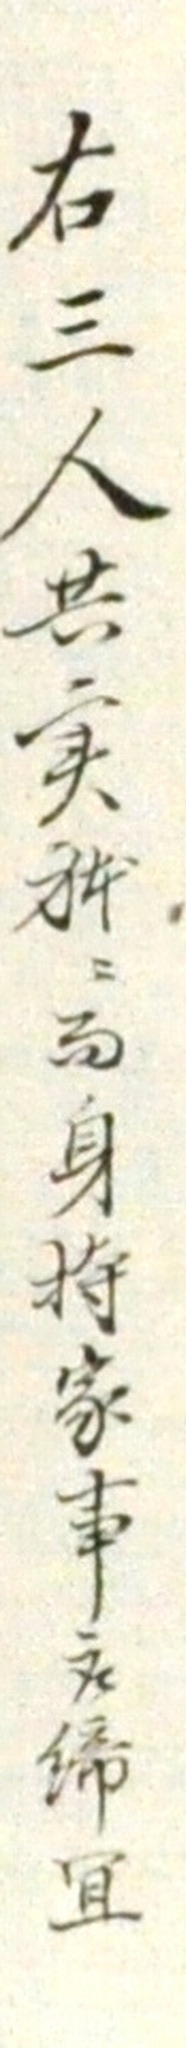右三人共実体ニ而身持家事取締宜
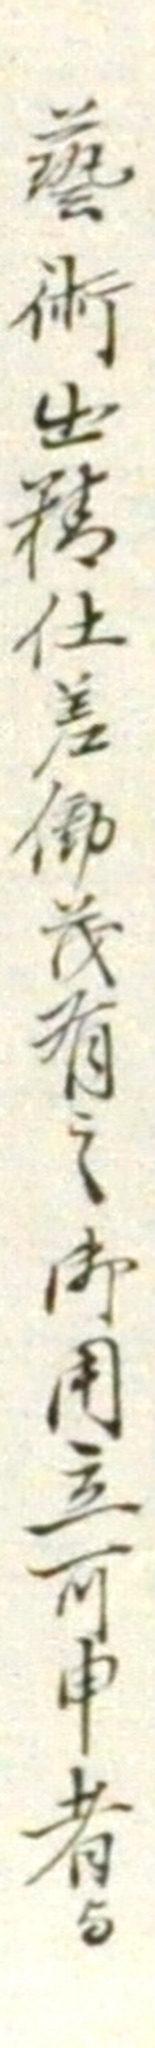芸術出精仕差働茂有之御用立可も申者与
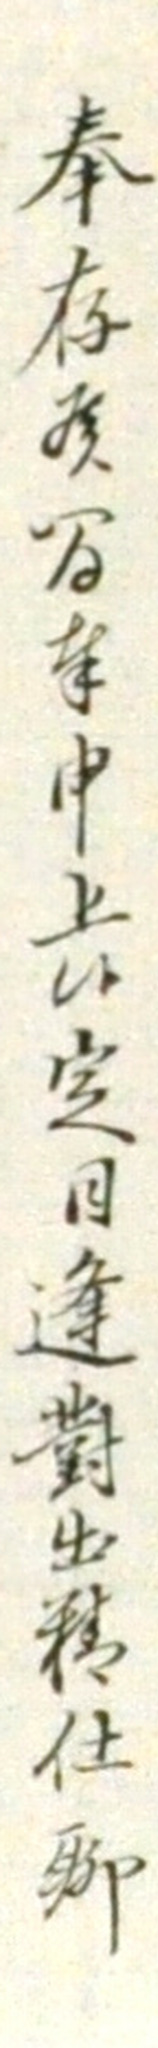奉存候間奉申上候定日逢対出精仕聊
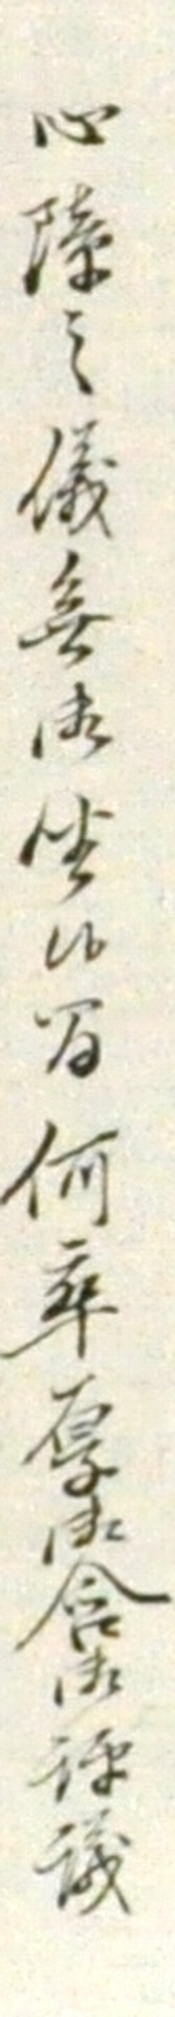心障之儀無御座候間何卒厚御含御評議
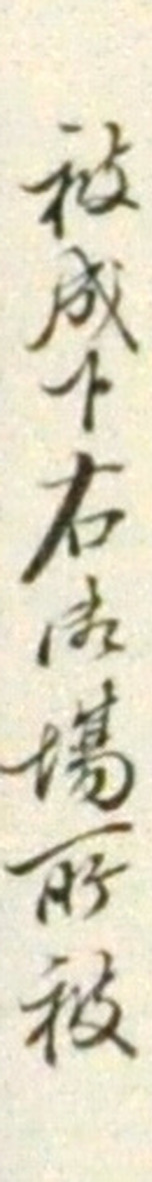被成下右場所被
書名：右大将様御書院番御用人見込書
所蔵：伊那市立高遠町図書館・合同会社AMANE
